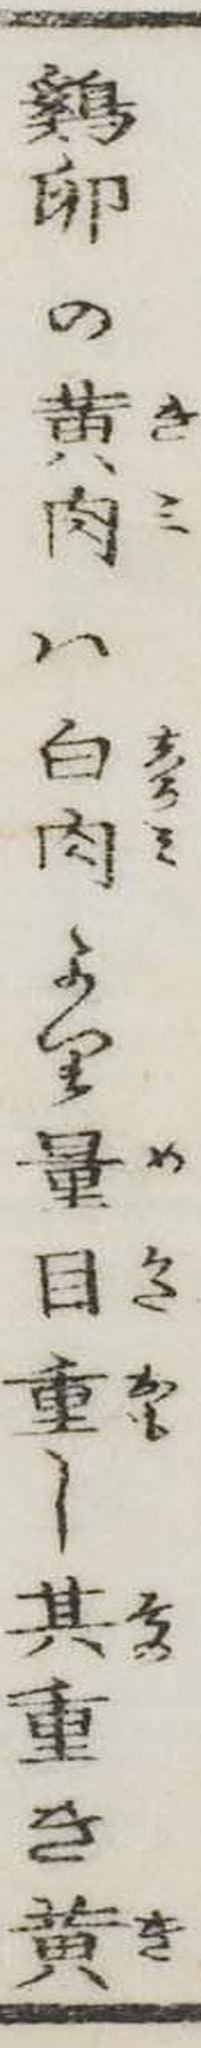鶏卵の黄肉は白肉より量目重し其重き黄
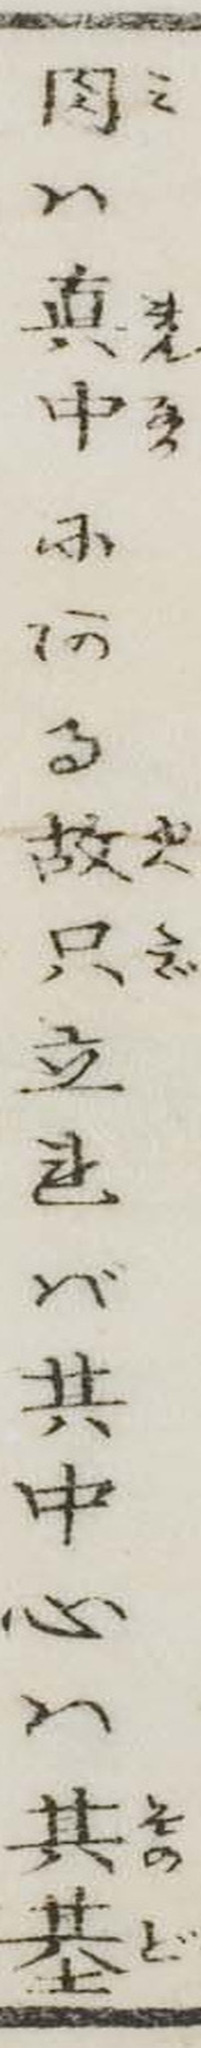肉は真中にある故只立れば其中心は其基
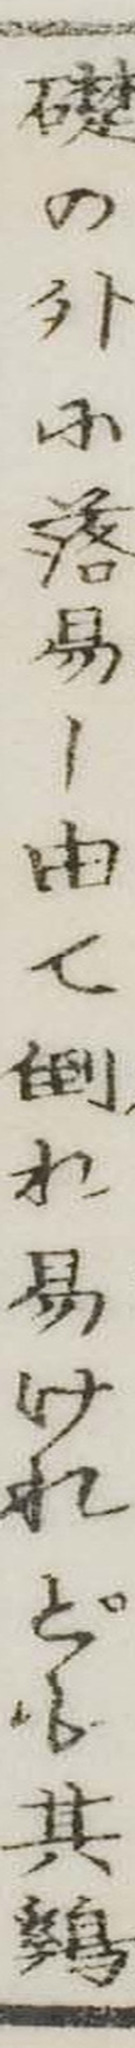礎の外に落易し由て倒れ易けれども其鶏
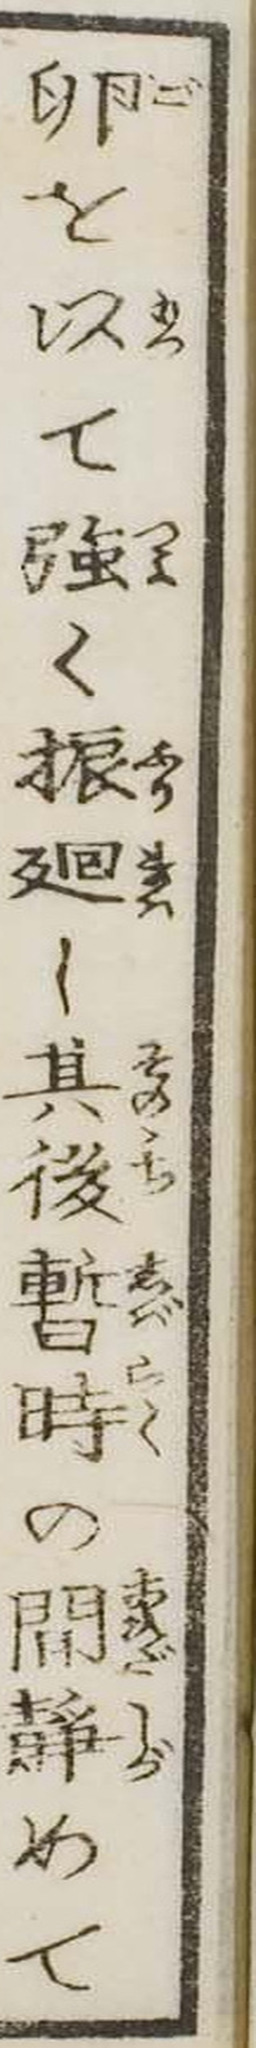卵を以て強く振廻し其後暫時の間静めて
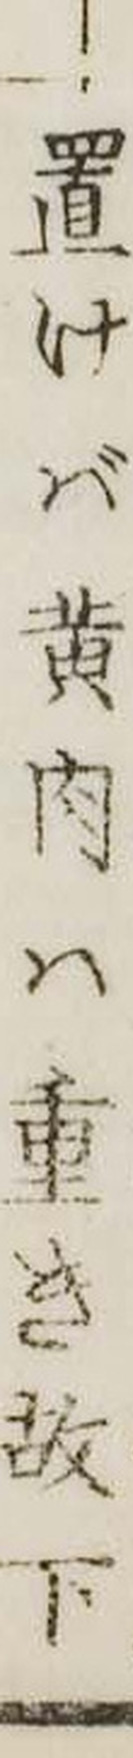置けば黄肉は重き故下
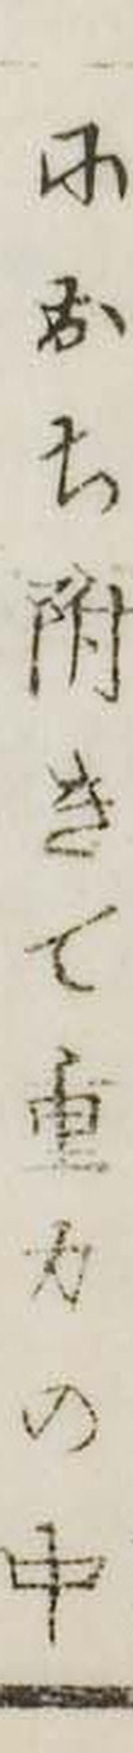におち附きて重力の中
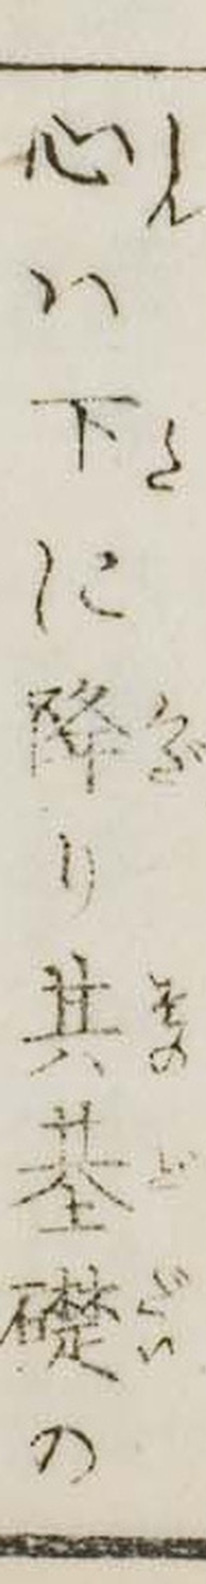心は下に降り其基礎の
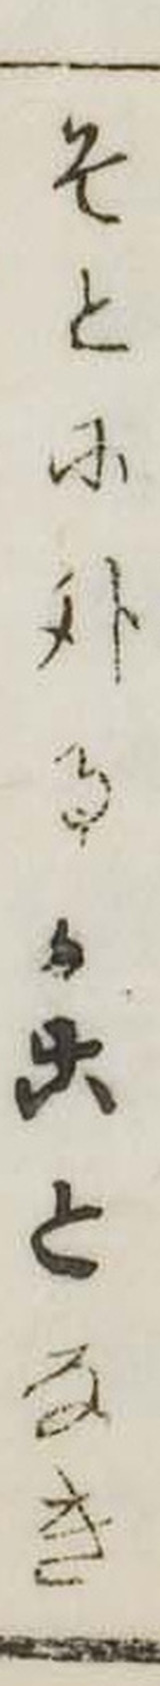そとに外るゝことなき
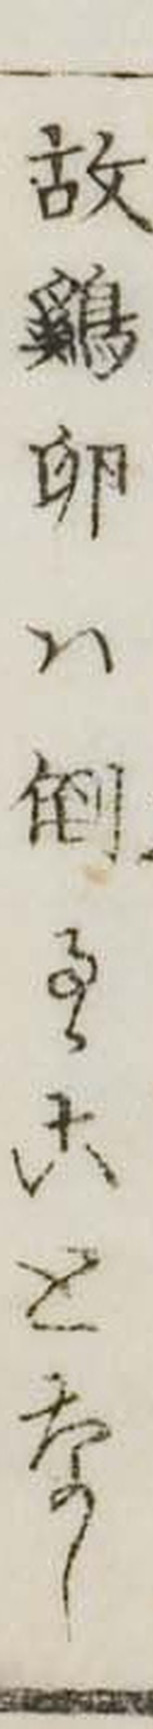故鶏卵は倒るゝことなし
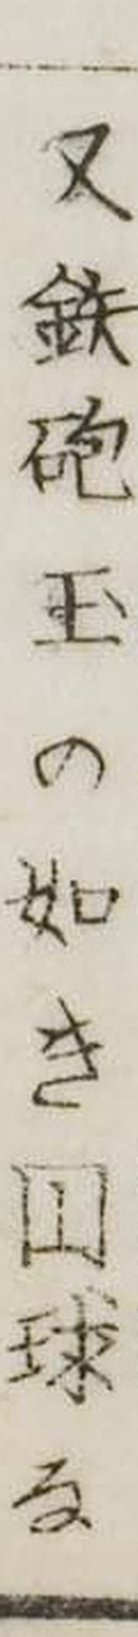又鉄砲玉の如き円球な
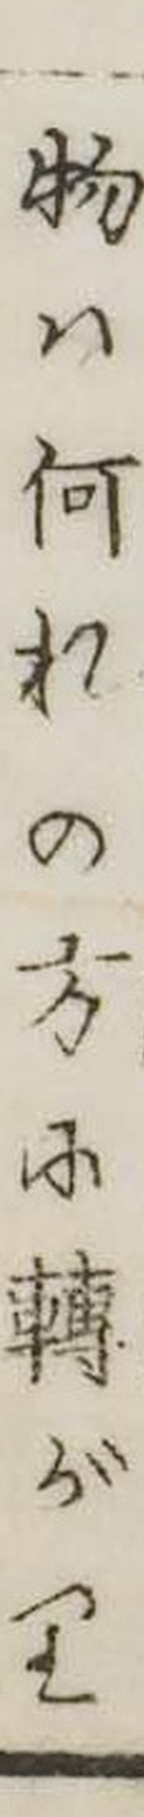物は何れの方に轉がり

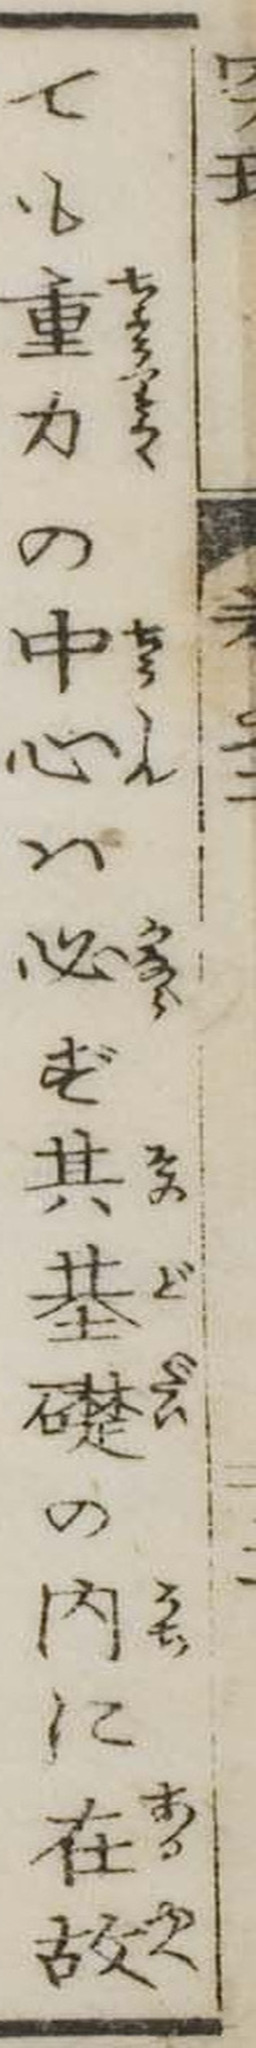ても重力の中心は必ず其基礎の内に在故
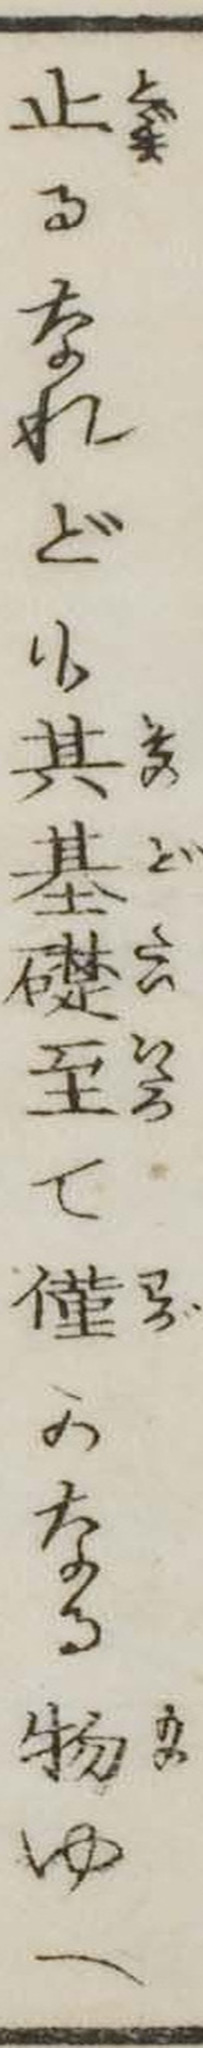止るなれども其基礎至て僅かなる物ゆへ
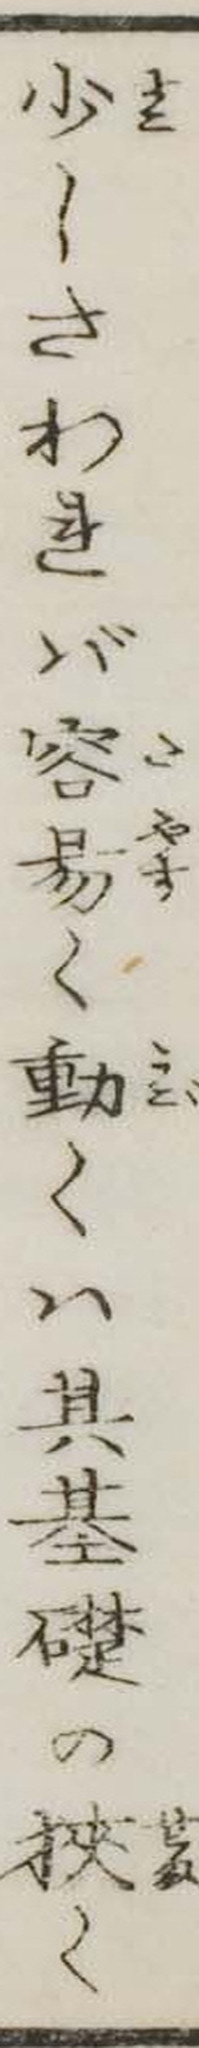少しさわれば容易く動くは其基礎の狭く
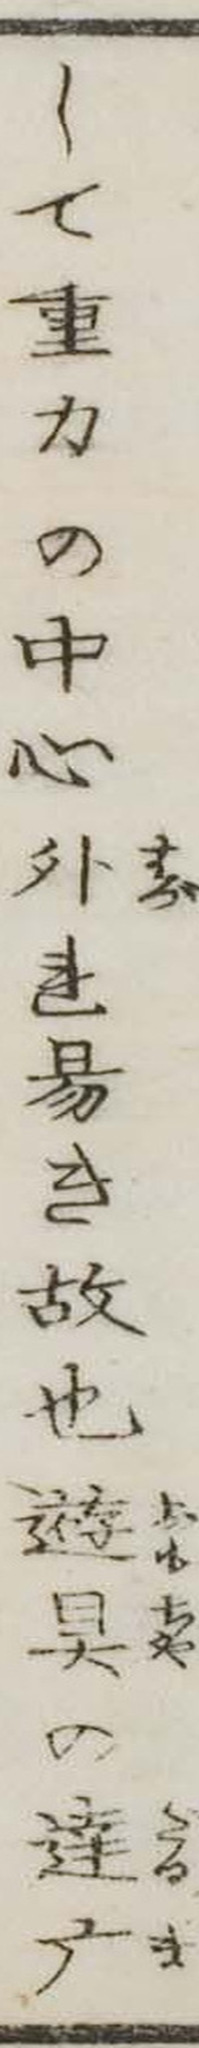して重力の中心外れ易き故也遊具の達磨
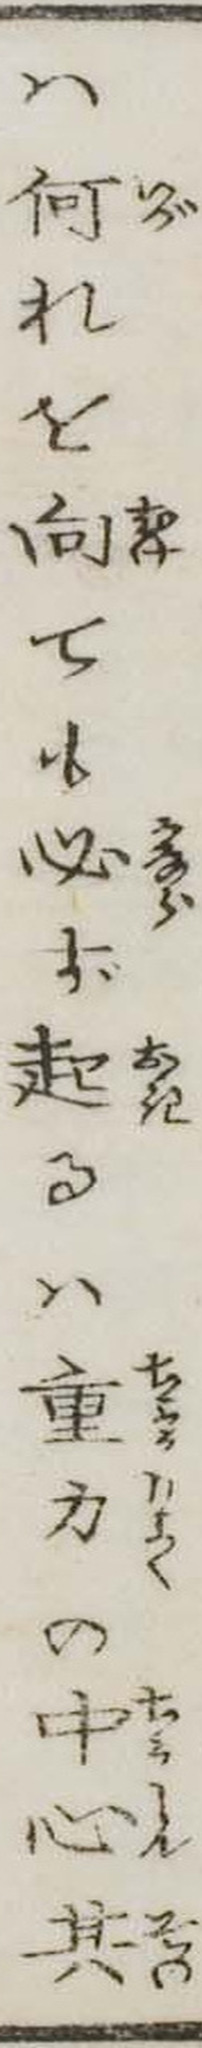は何れを向ても必ず起るは重力の中心其
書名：究理知慧の勧 : 訓蒙画入 巻之2
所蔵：東京学芸大学附属図書館
